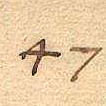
47
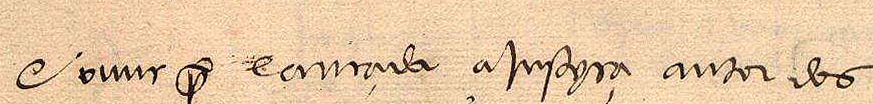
e ouue p̄o lançada a Justyça autor dos
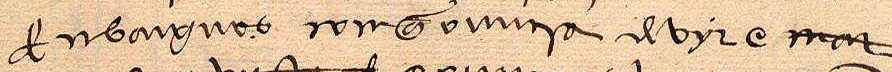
Enbarguos com q̄ ouuera de vyr e man
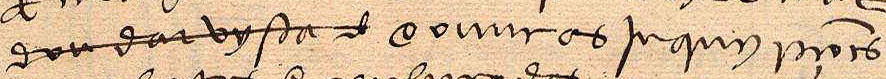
dou dar vysta d e ouue as Jnquyrições
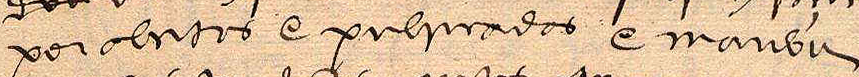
por abertas e pubricadas e mandou
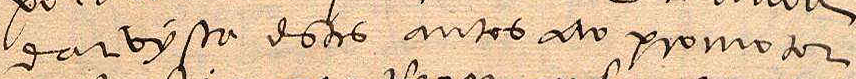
dar vysta destes autos ao promotor
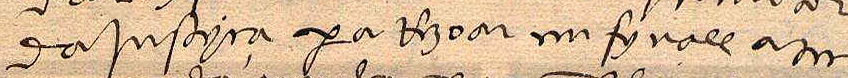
da Justyça ꝑa Rezoar em fynall atee
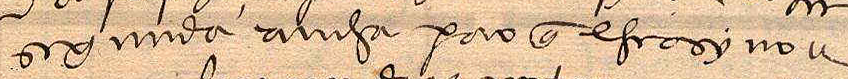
segunda audja ꝑa o q̄ lhe asynou
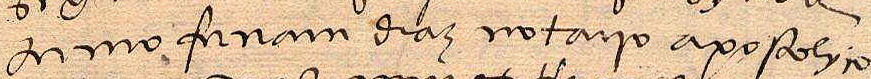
termo fernam diaz notairo apostolyco
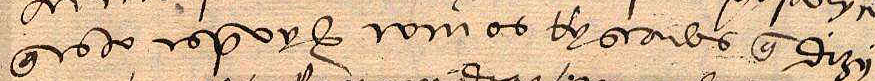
q̄ esto esp̄vy com os Ryscados q̄ dizy
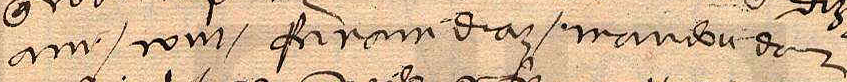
am / com / fernam diaz / mandou dar
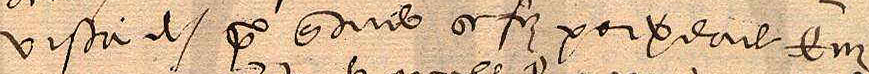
vista d / p̄oq̄ tudo se fez por ꝟdade Em
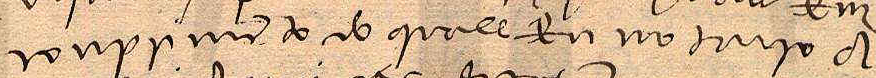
conprimēto do quall Eu notairo A
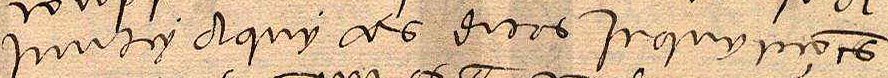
Juntey Aquy as ditas Jnquyrições
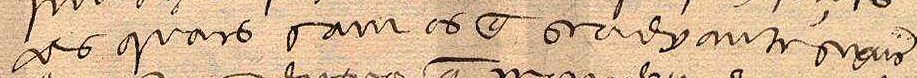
as quaes sam as q̄ se a dyante seguē
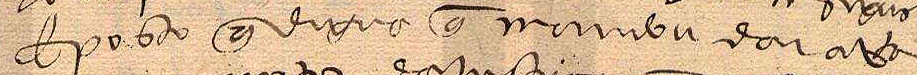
E posto q̄ diga q̄ mandou dar a vta
